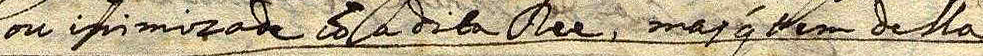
ou inimizade cō a dita Ree, mas q̄ tem della
